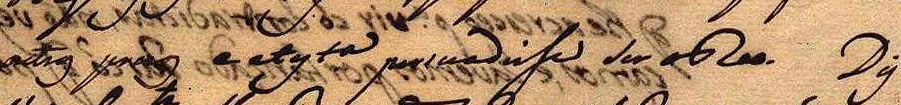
outros prezos e a test.a persuadisse ser o Reo. Dis
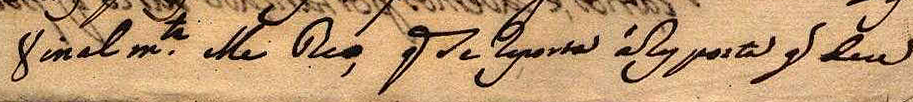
finalm.te elle Reo, q̄ se Reporta á Resposta q̄ dece
